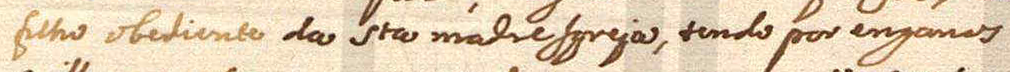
filho obediente da sta madre Jgreja, tendo por enganos
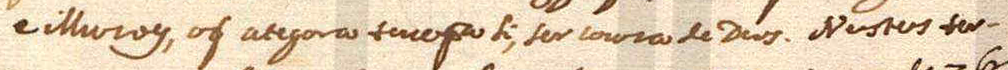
e illuzoes, o q̄ ategora teue pa si, ser couza de Deos. Nestes ter
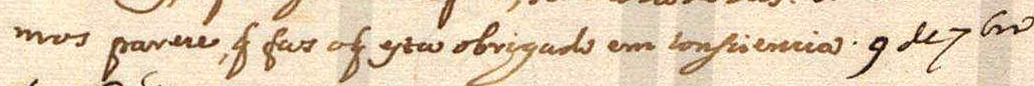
mos parece, q̄ fas o q̄ esta obrigado em consciencia. 9 de 7bro
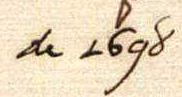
de 1698
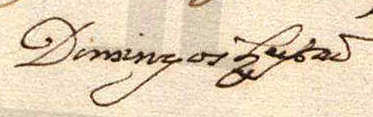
Domingos Leytaõ
